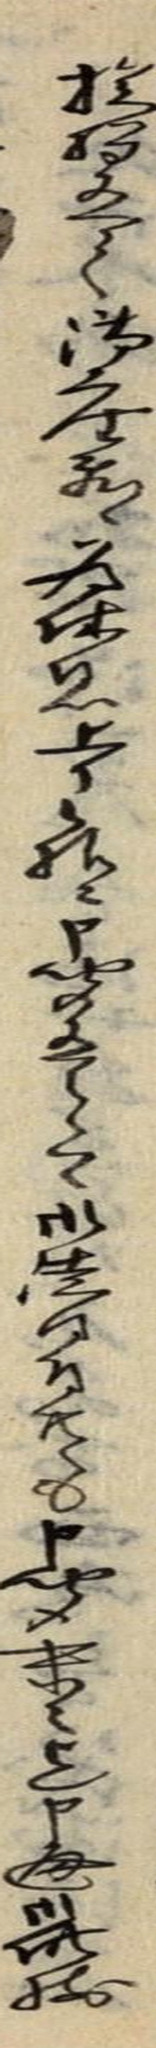挨拶有之御座敷へ為休息上り候様申聞有之候はゝ御徒目付共へも申聞末々迄申通御供揃
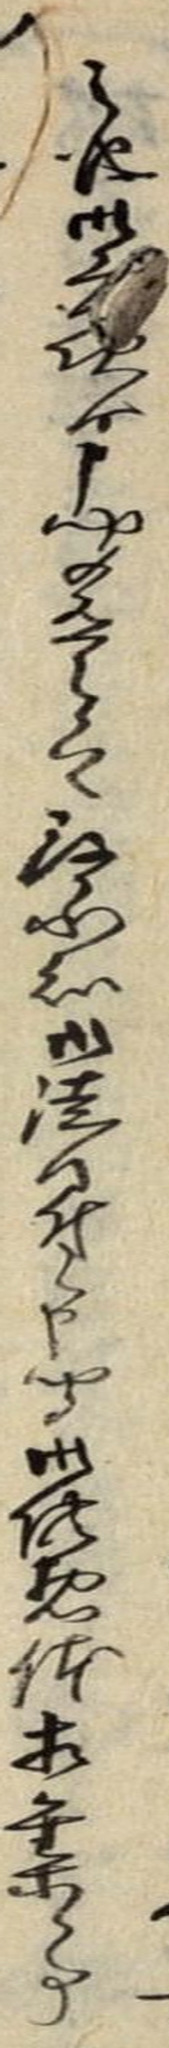之儀御取次ゟ申聞有之候はゝ致承知御徒目付へ申聞御供惣体相集事
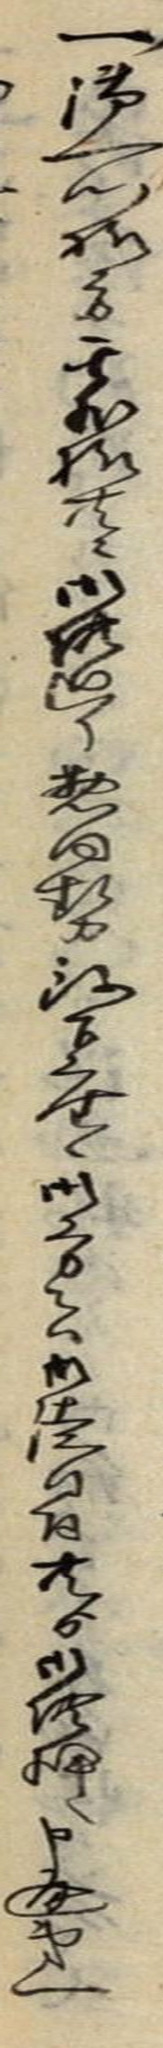一御一門様方其外様共に御供廻り惣同勢致下座候御方には御徒目付共ゟ御供押へ申通第一
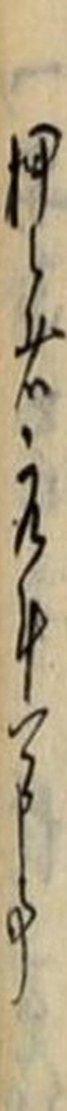押之者取計可申事
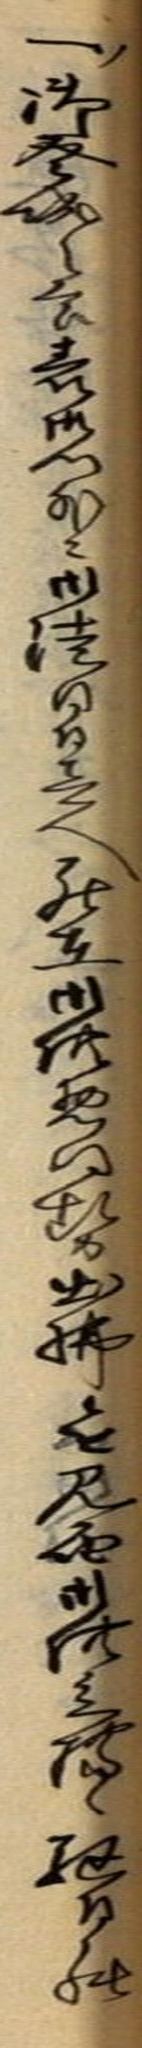一御登城之節表御門外に御徒目付壱人罷在御供惣同勢出払之候を見届御供立場へ駆付罷
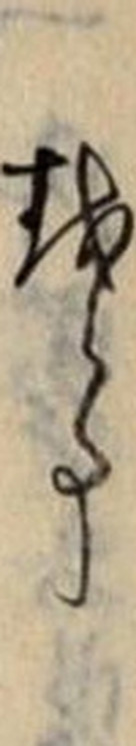越候事
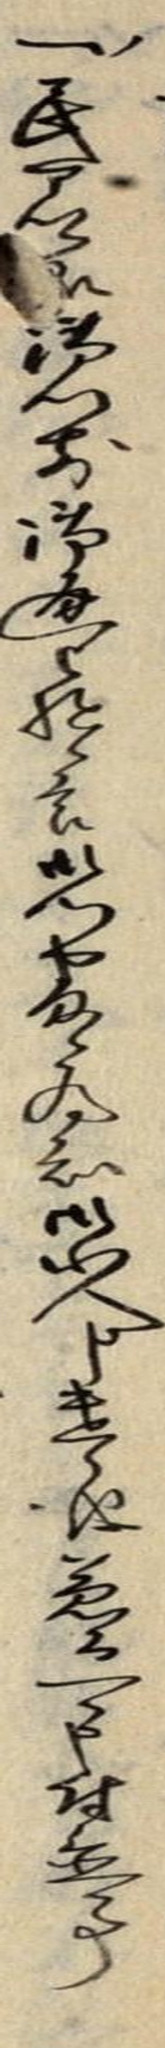一民部卿様御門前御通被遊候節御門番へ為知御小人申遣候儀兼て可申付置事
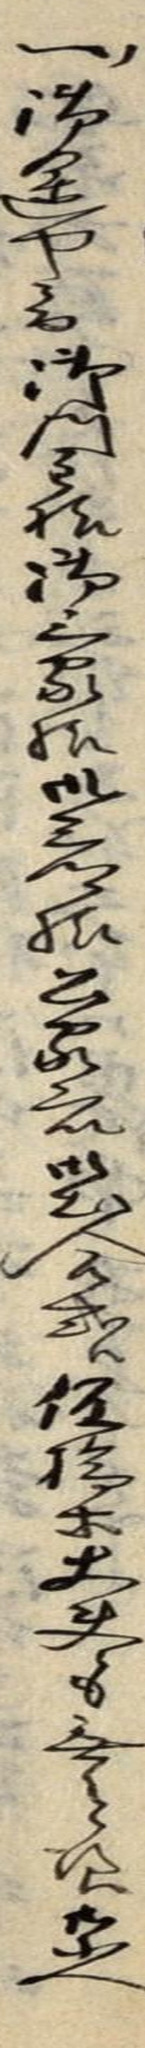一御途中にて御門主様御三家様御三卿様公家衆御出合或は仮橋等丈夫にも無之候得は御小人
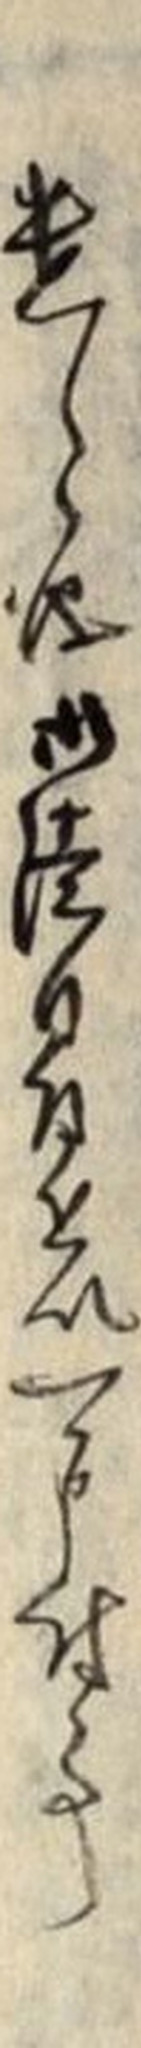遣し候儀御徒目付を以可申付事
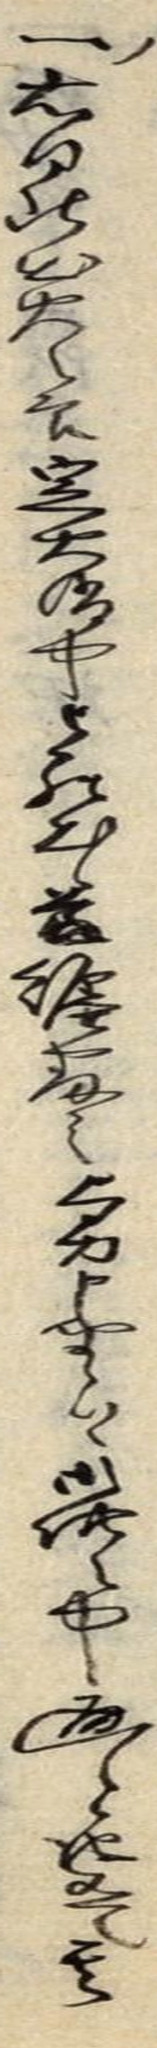一右同断出火之節定火消中被罷出候節纏番之与力申聞候はゝ御供之中通し候儀有之其
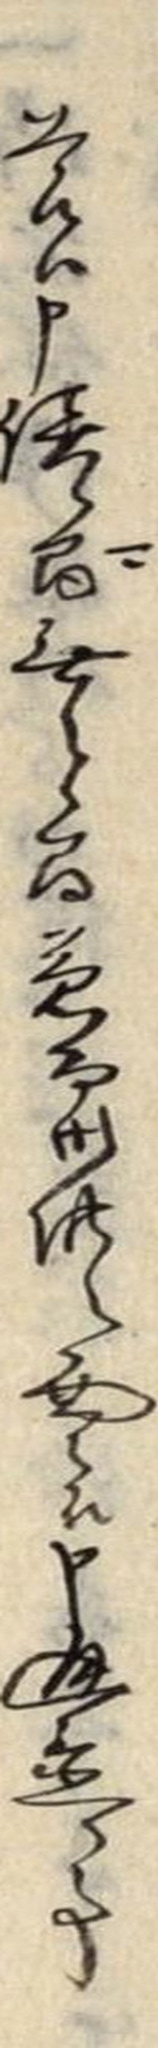節は申談候間無之候間兼て御供之面々江被申通置候事
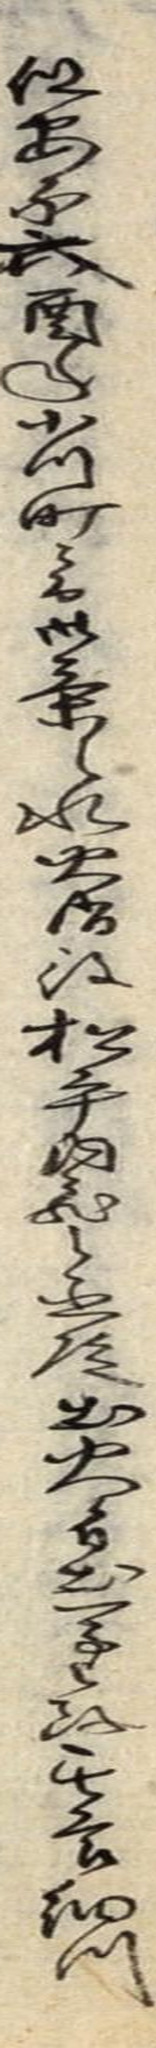但安永六酉年小川町にて御茶之水火消役松平内蔵之丞殿出火に付出馬被致其節細川
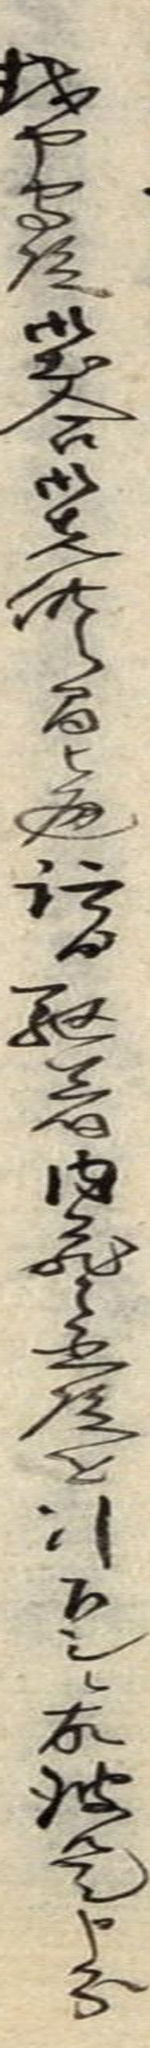越中守殿御出合御先供之間被通跡ゟ駆着内蔵之丞殿を引下し候故彼是申分
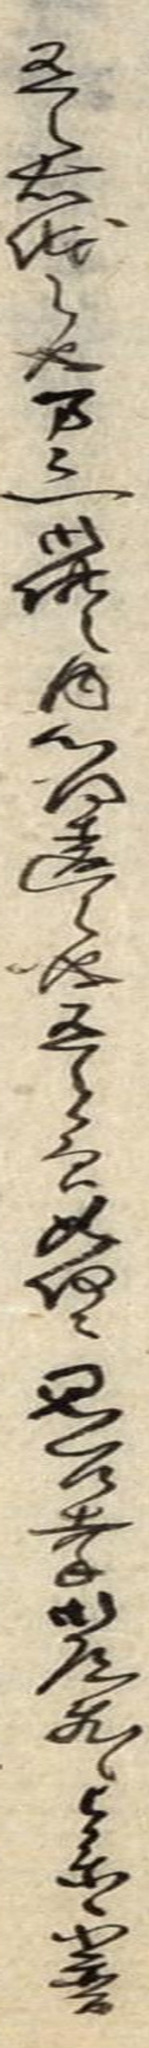有之右体之儀万々一御供之内心得違之儀有之候ては如何に思召幸御屋敷へ被参候小普
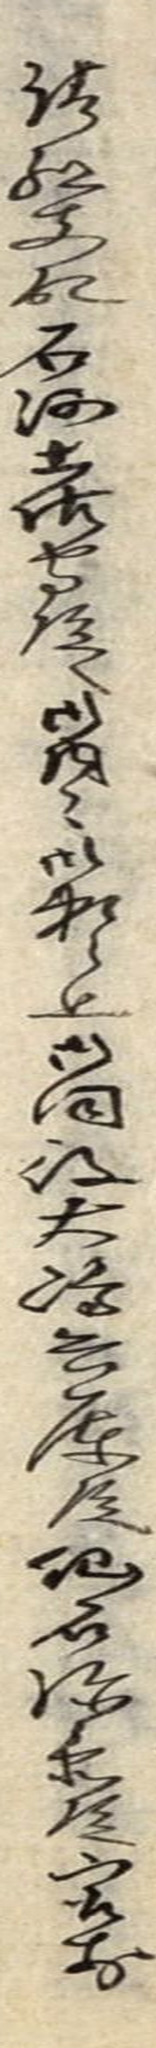請組支配石河土佐守殿へ御内々御頼之上御伺役大嶋兵庫殿仙石弥兵衛殿最前
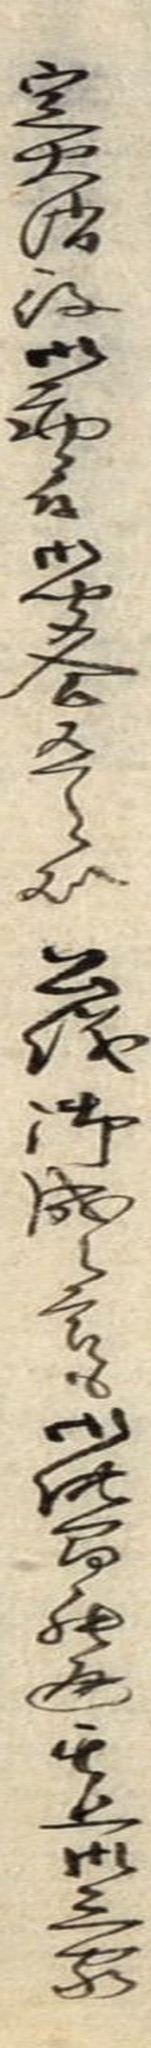定火消役御勤に付御聞合有之候処公儀御成之節も御供間罷通其上御三家
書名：三都并道中之部
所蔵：福井県文書館 Fukui Prefectural Archives
